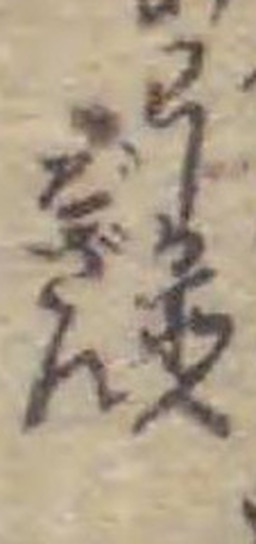ござれ
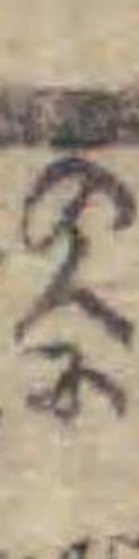の人に
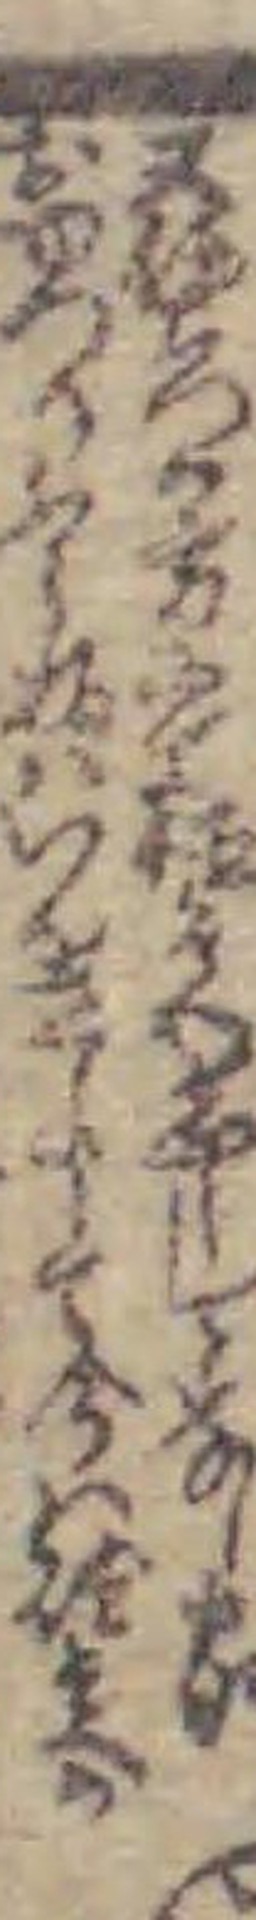おゆつりふう婦はいんきよして今は徳兵への
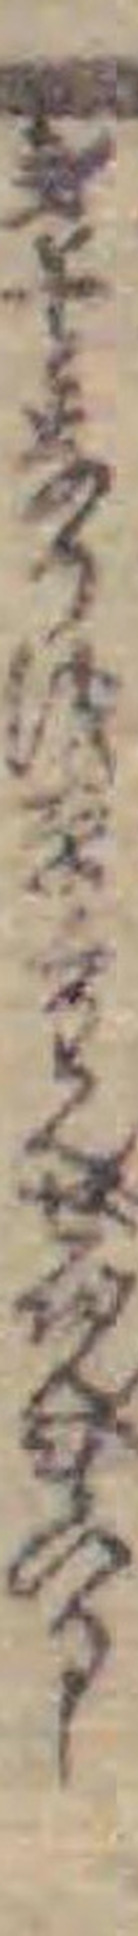身上となり浅草寺かんぜおんまいり
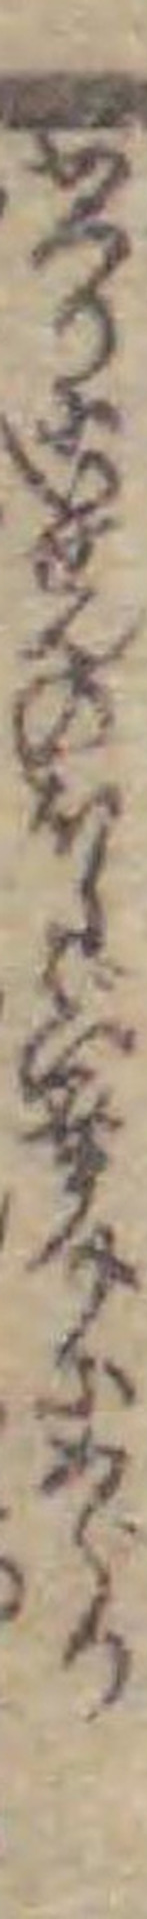かへりにいせんのほうばい幸介にめぐり
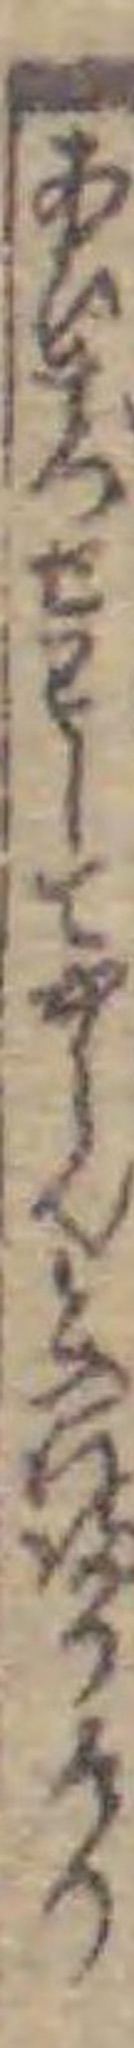あひまつ世話してやらんと入れたりけり

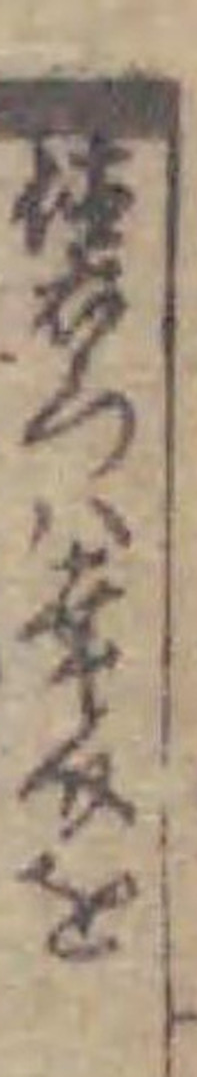徳右衛門は幸介を
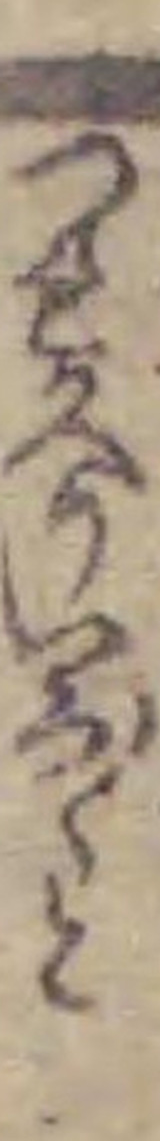つれかへりいろ〳〵と
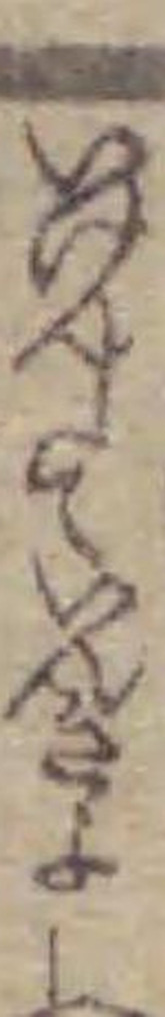いけんしていんきよ
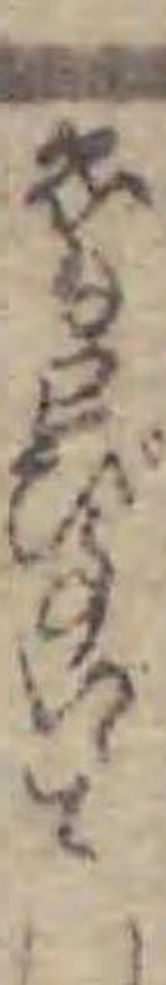所もわび事いゝて
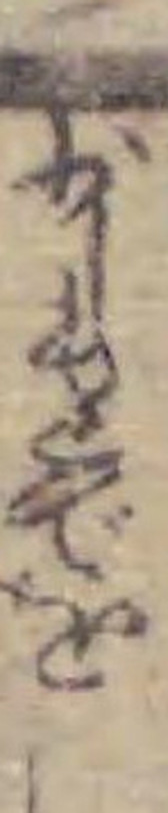かしもとでを
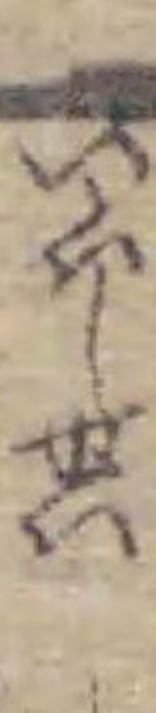つかはしせは
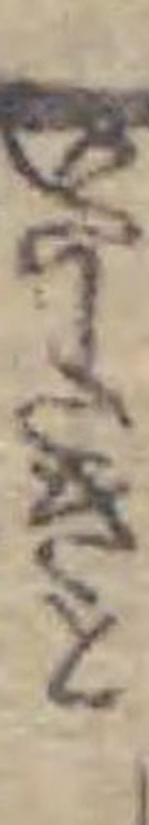いたしたきと
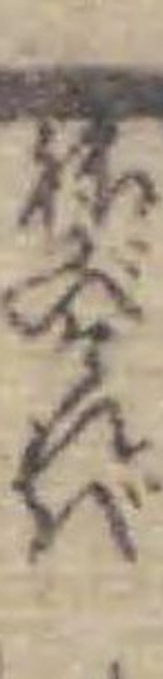ねがいければ
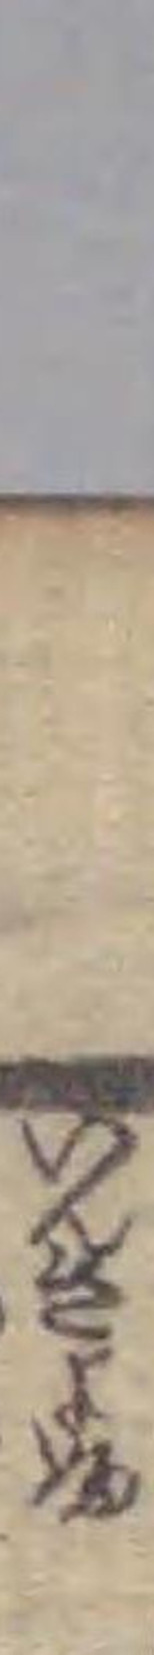いんきよふ
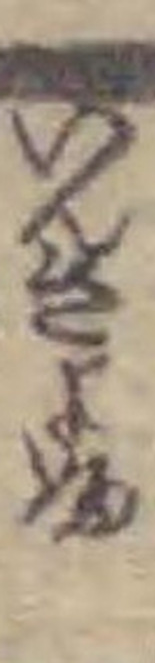いんきよふ
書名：通風伊勢物語 : 3巻
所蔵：国立国会図書館 National Diet Library, JAPAN
